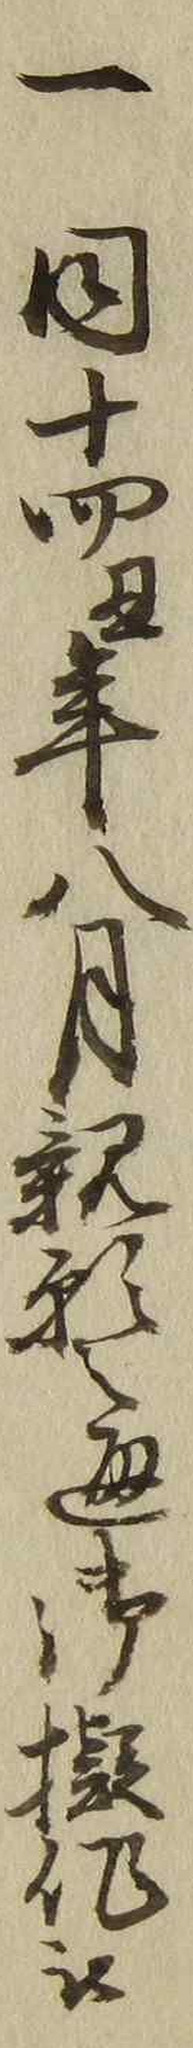一同十四丑年八月親願之通御擬作被
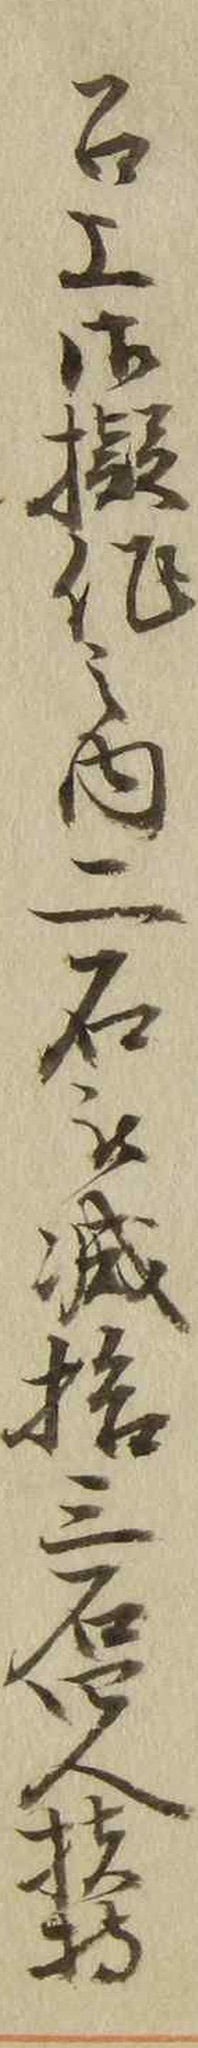召上御擬作之内二石減拾三石四人扶持

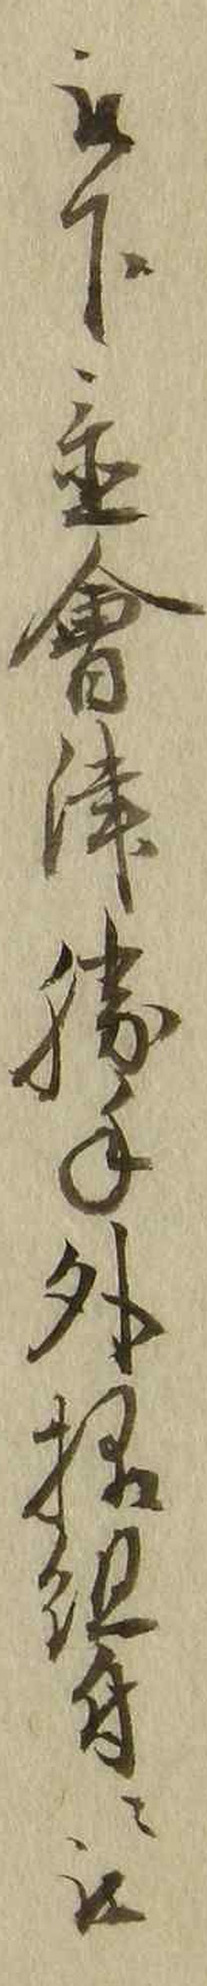被下置会津勝手外様組付ニ被
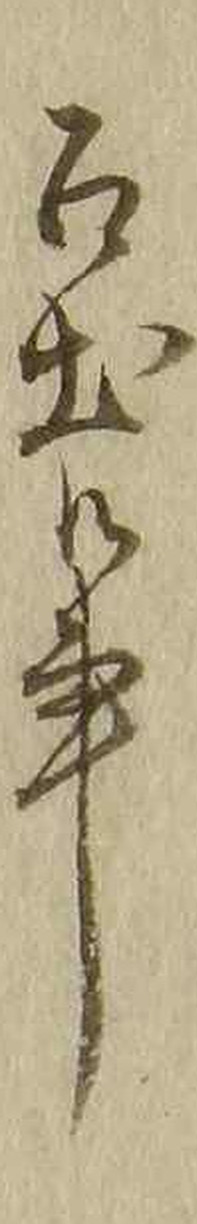召出候事
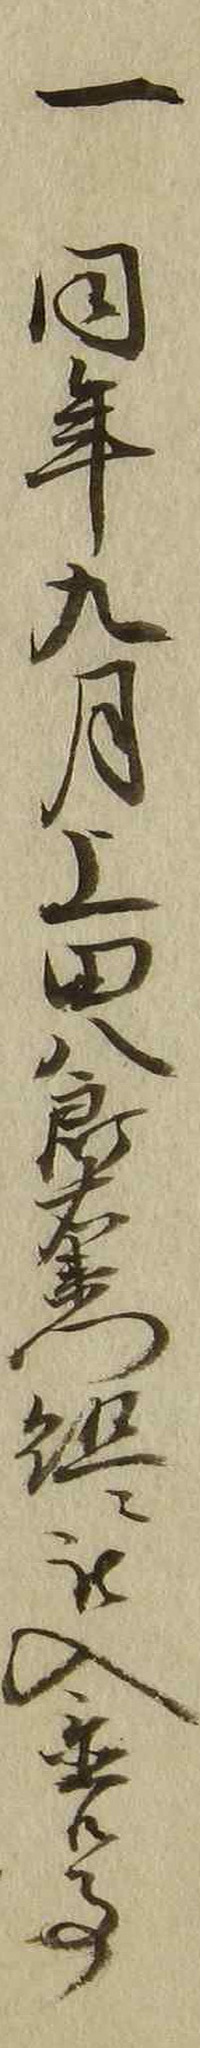一同年九月上田八郎右衛門組ニ被入置候事
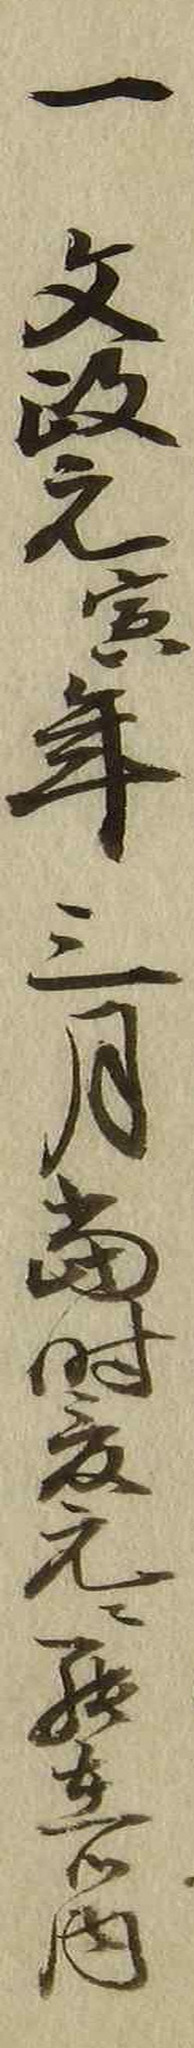一文政元寅年三月当時爰元ニ罷在御内
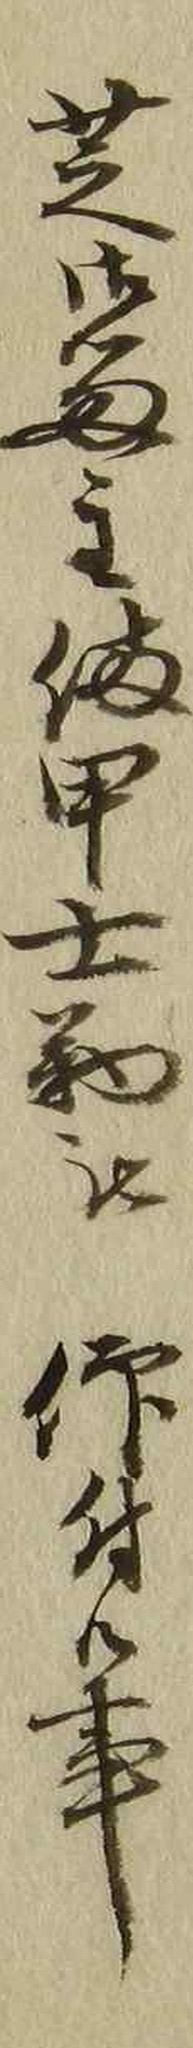芝御留主備甲士勤被仰付候事
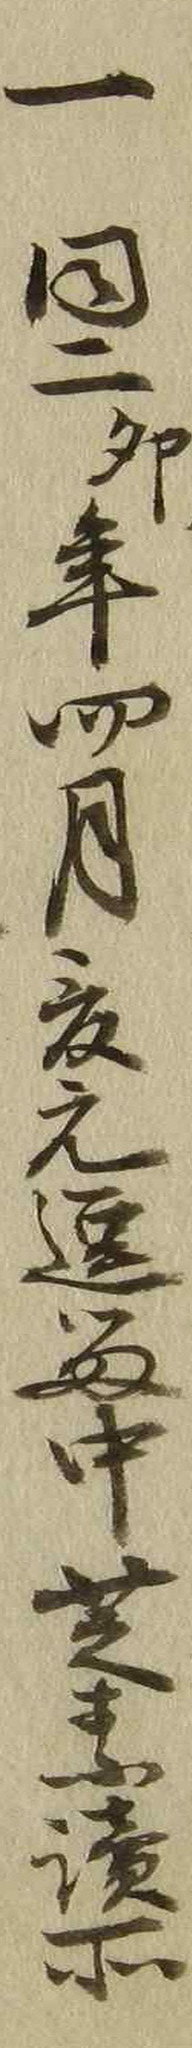一同二卯年四月爰元逗留中芝素読所
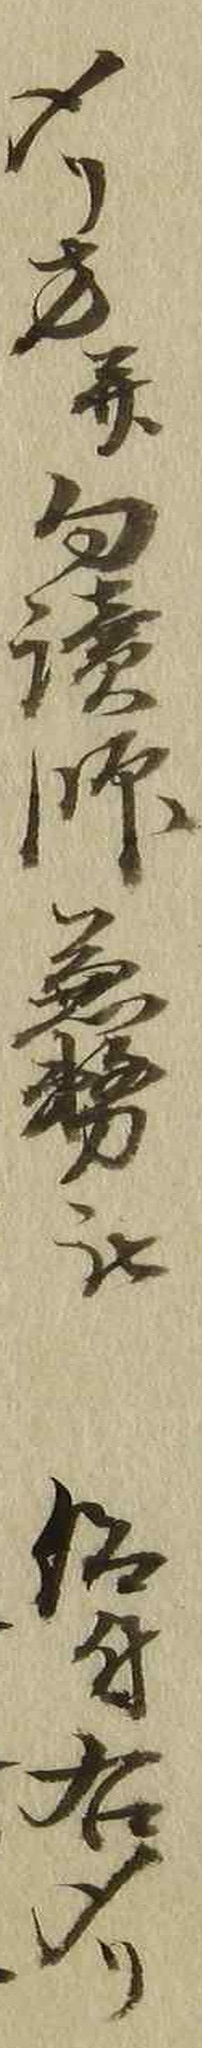〆り方并句読師兼務被仰付右〆り
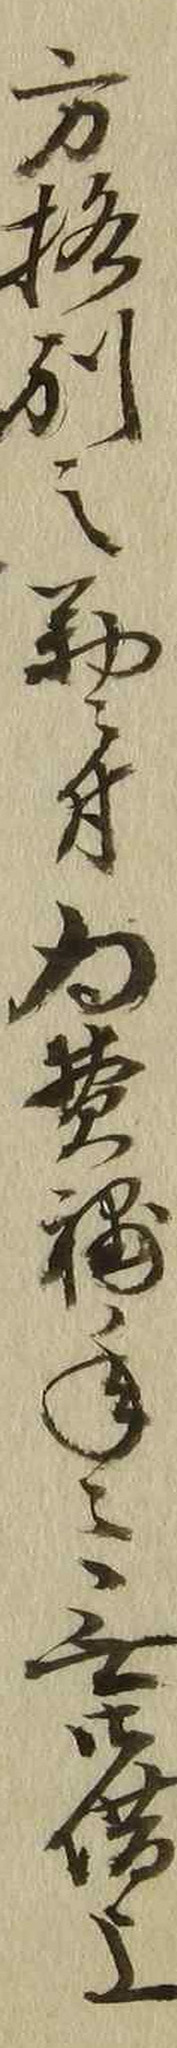方格別之勤ニ付為費補年々無御借上
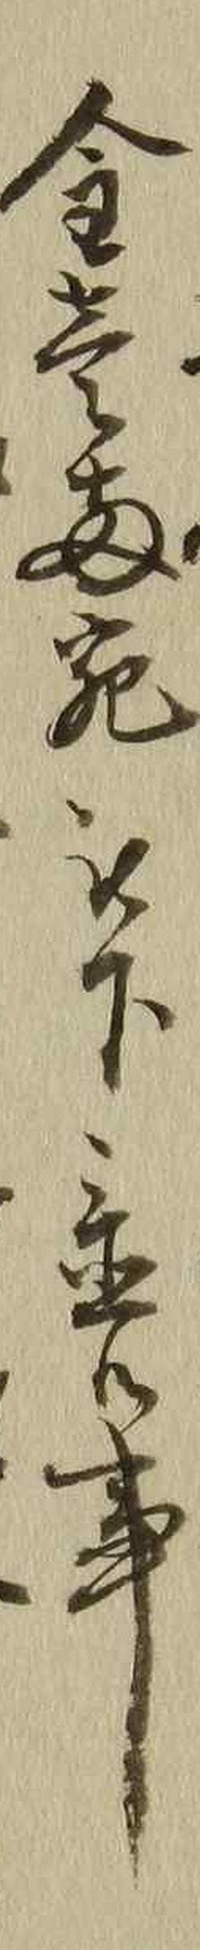金壱両宛被下置候事
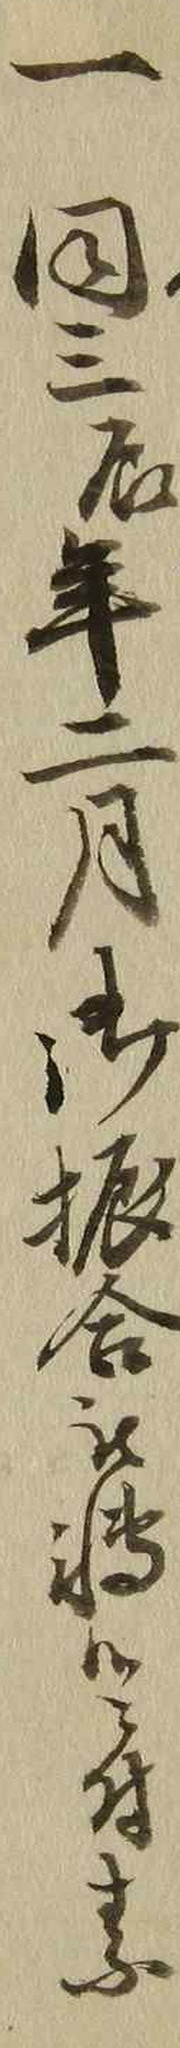一同三辰年十二月御振合被轉候ニ付素
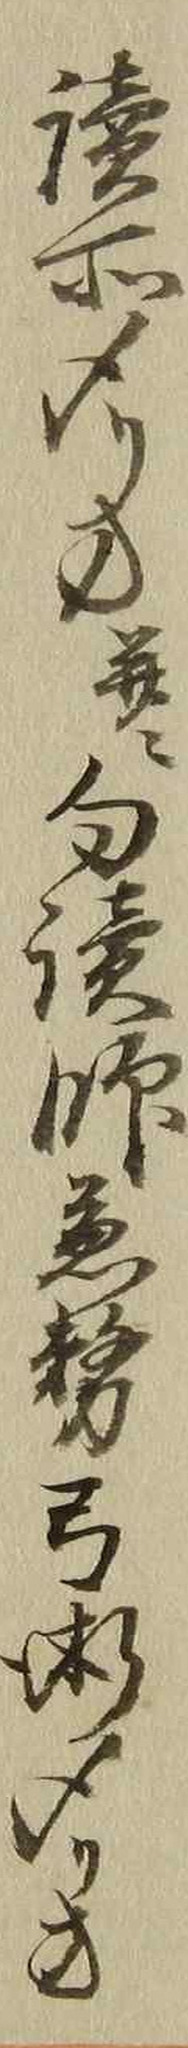読所〆り方并句読師兼務断〆り方
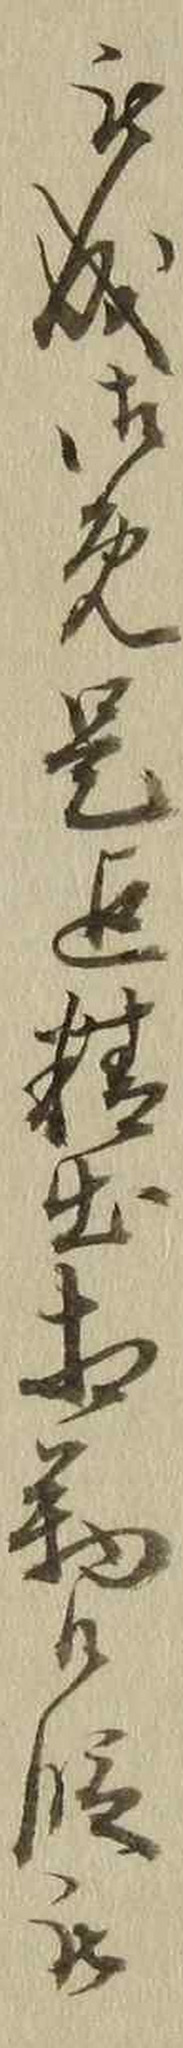被成御免是迄精出相勤候段被
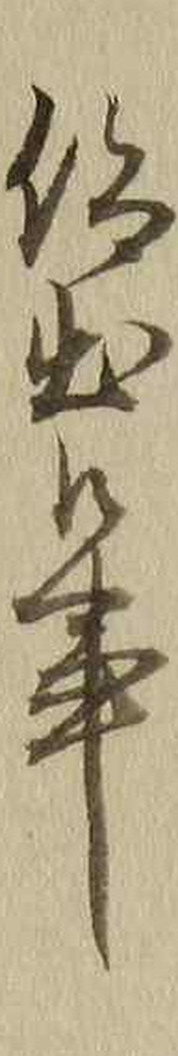仰出候事
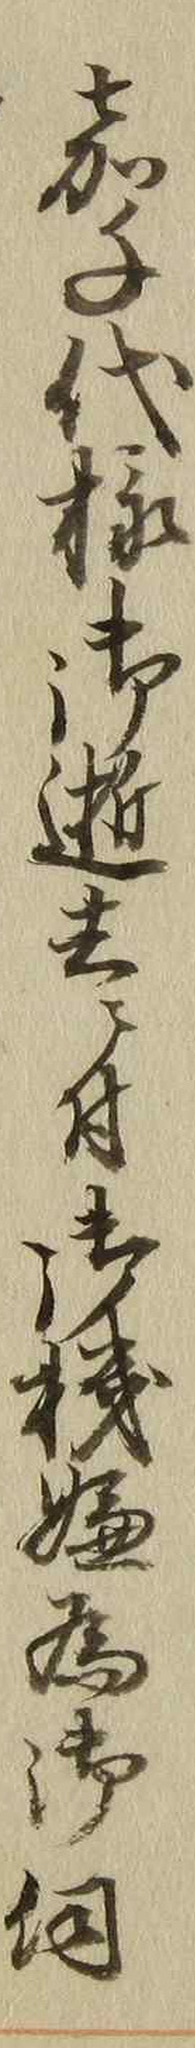嘉千代様御逝去ニ付御機嫌為御伺
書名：諸士系譜　巻之64　と之部7
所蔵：会津若松市立会津図書館
